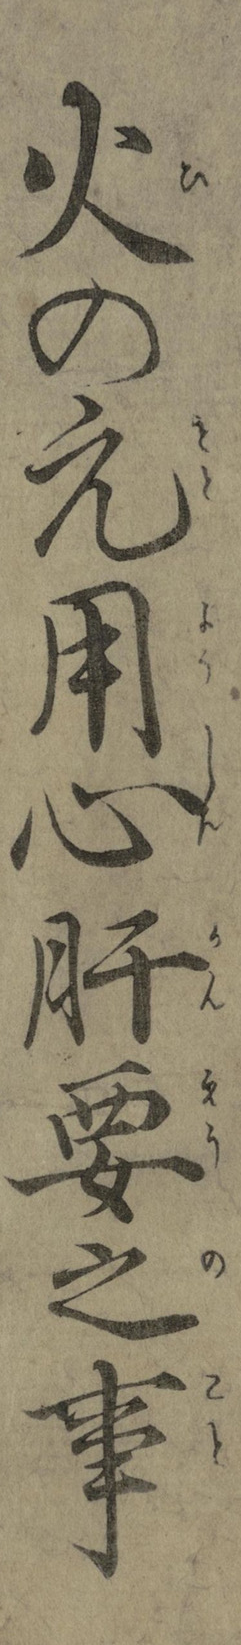火の元用心肝要之事
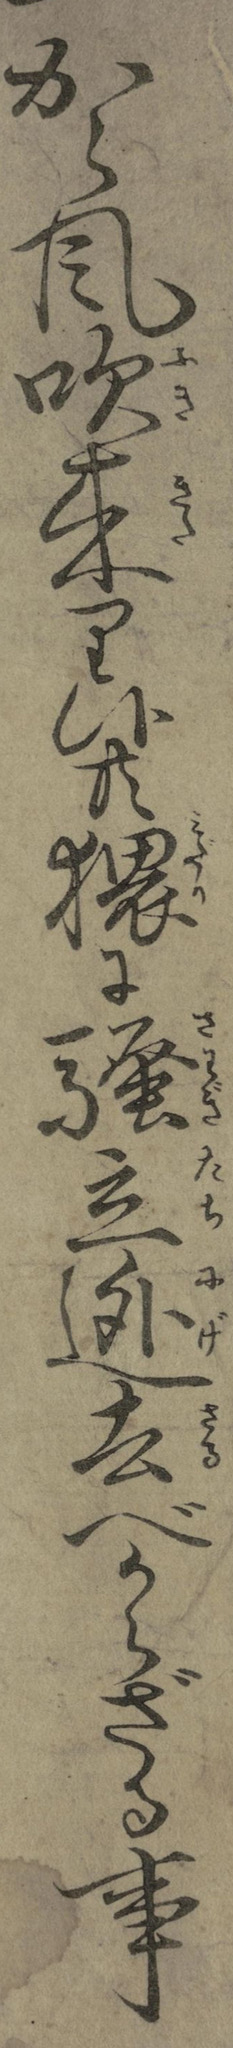一から風吹来り候共猥に騒立迯去べからざる事
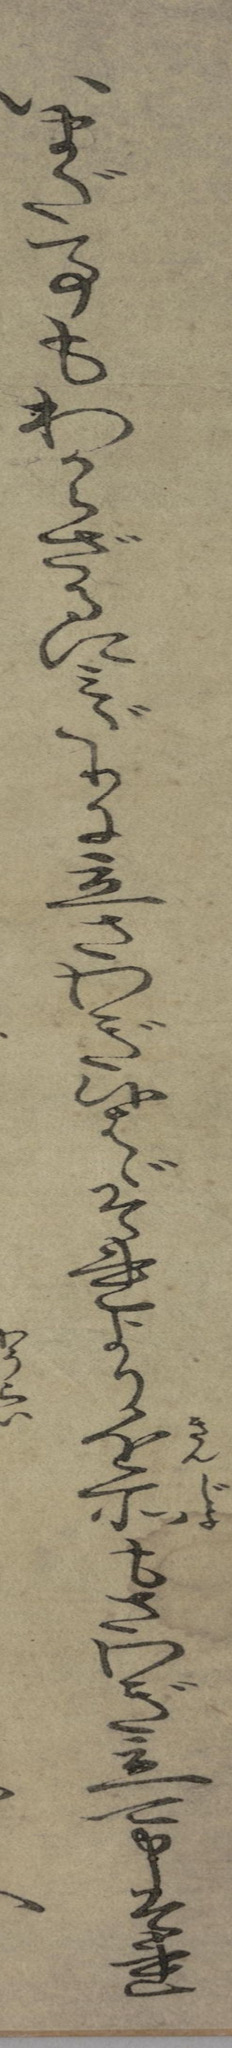いまだ事もわからざるにみだりに立さわぎ候はばそれより近所もさわぎ立て申それ
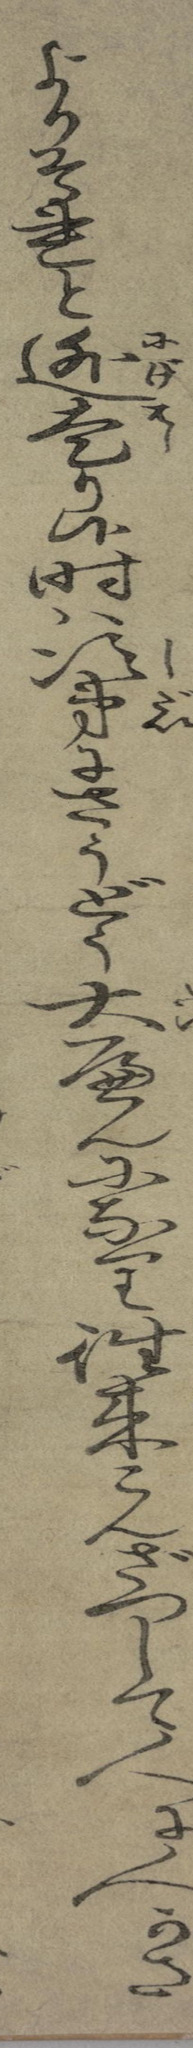よりそれと迯走り候時は次第にさうどう大へんになり往来こんざつして人に人かさ
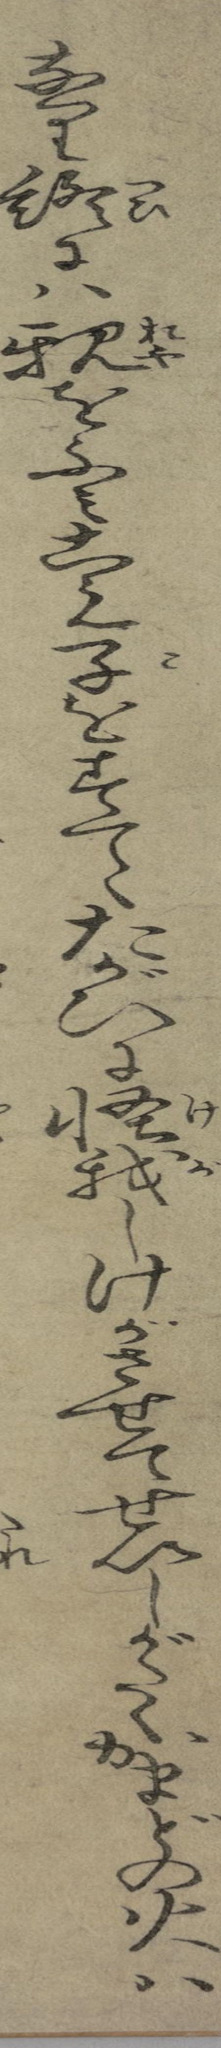なり終には親をふみこえ子をすてゝたがひに怪我しけがさせてせいしがたくかまどの火は
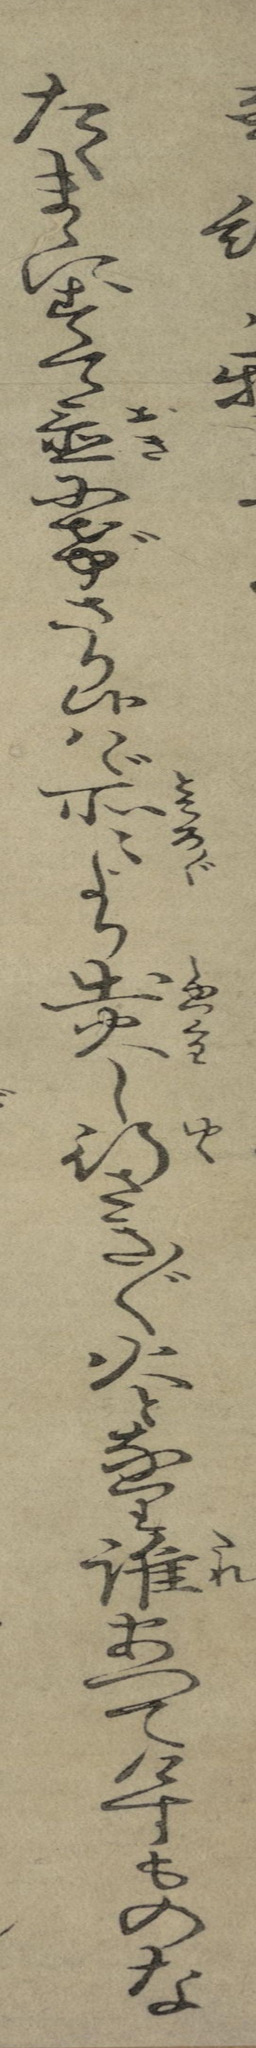たくまゝにすて置にげさり候はゞ所〻より出火し行さき〴〵火となり誰あつてけすものな
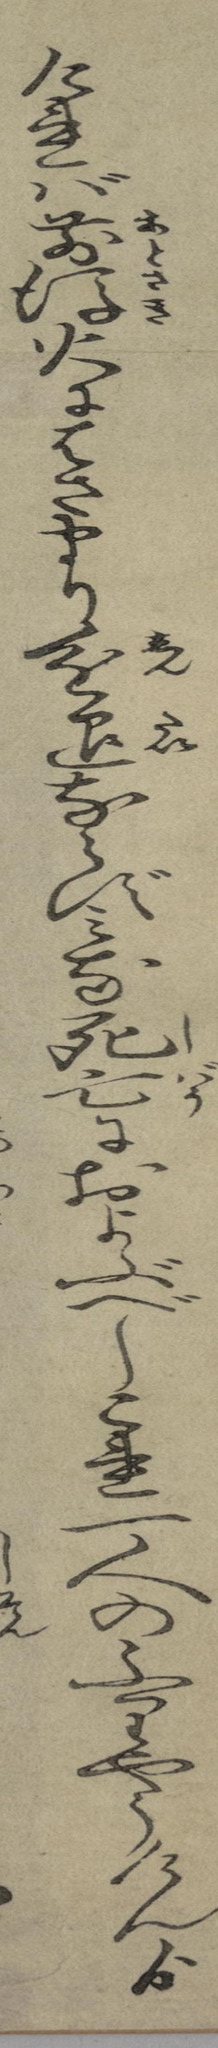ければ前後火にはさまり遠退ならずみな死亡におよぶべしこれ一人のふりやうけんゟ
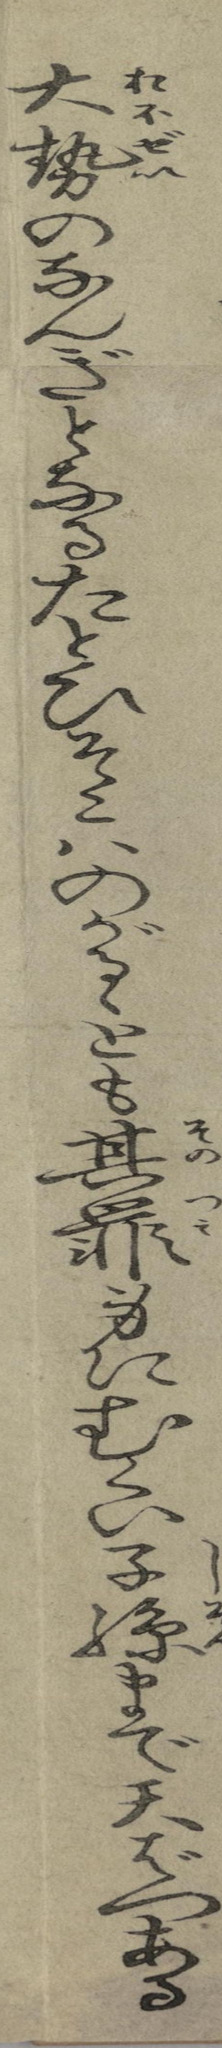大勢のなんぎとなるたとひそこはのがるゝとも其罪身にむくい子孫まで天ばつある
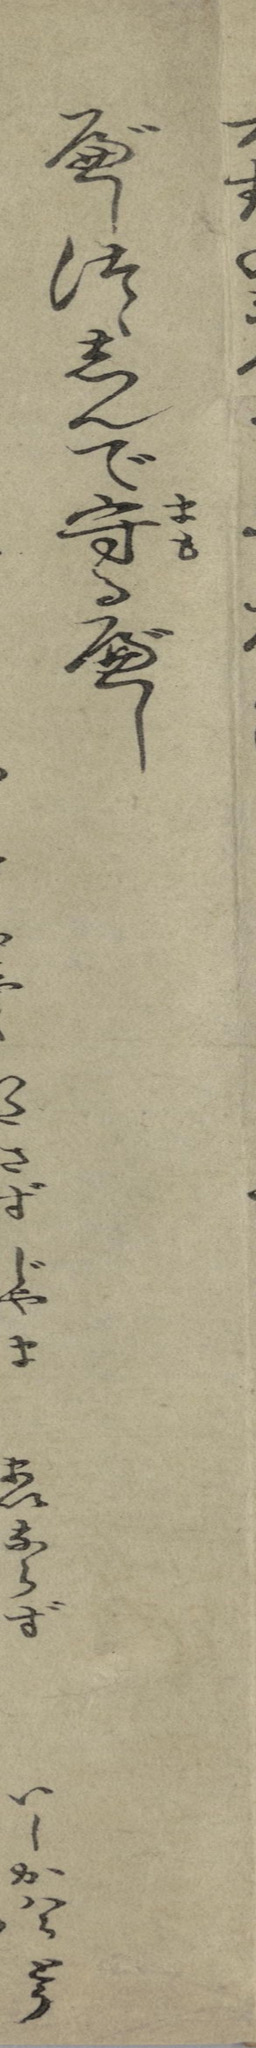べしつゝしんで守るべし
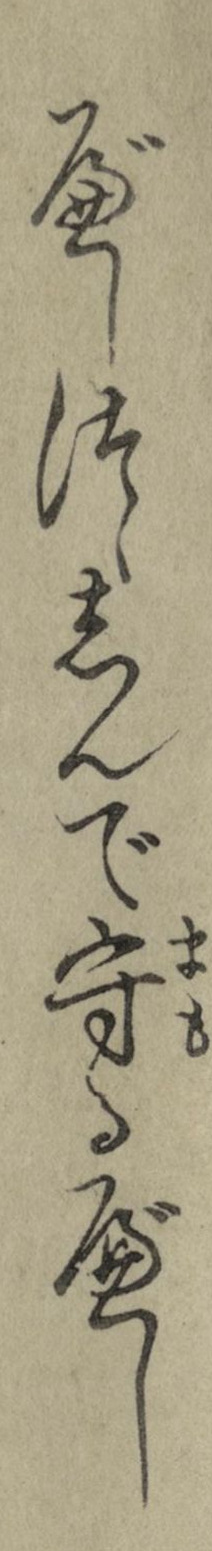べしつゝしんで守るべし
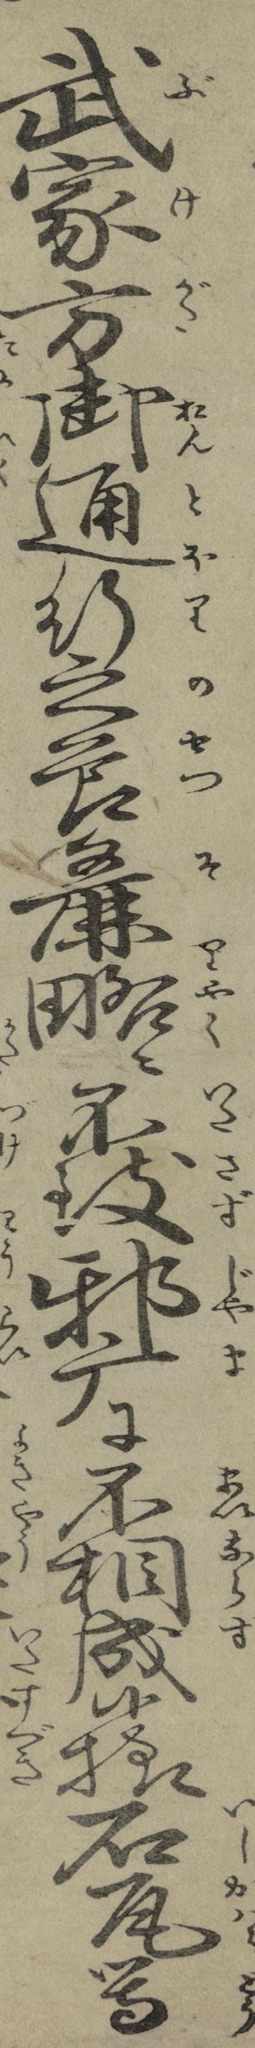一武家方御通行之節麁略に不致邪魔に不相成候様石瓦等
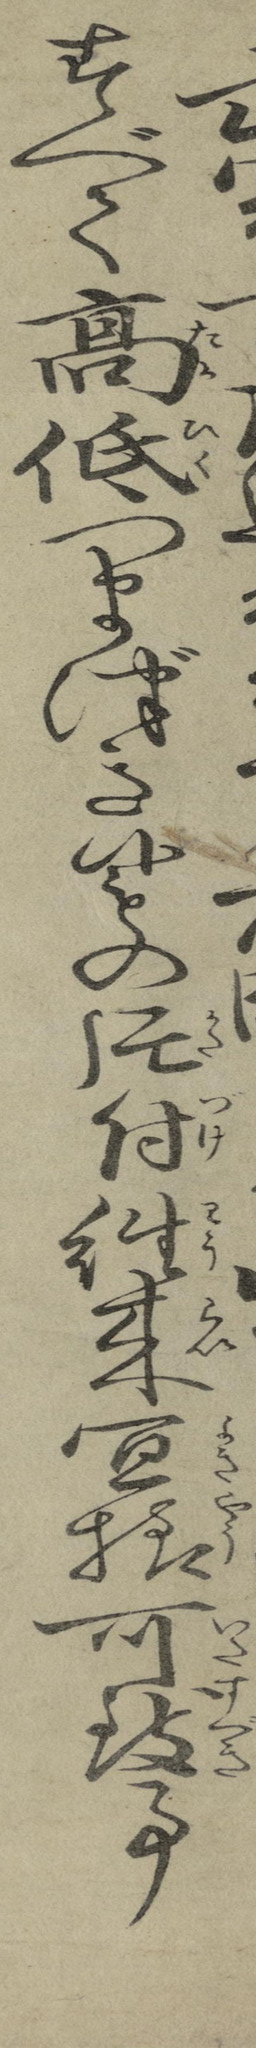すべて高低つまづき候もの片付往来冝様可致事
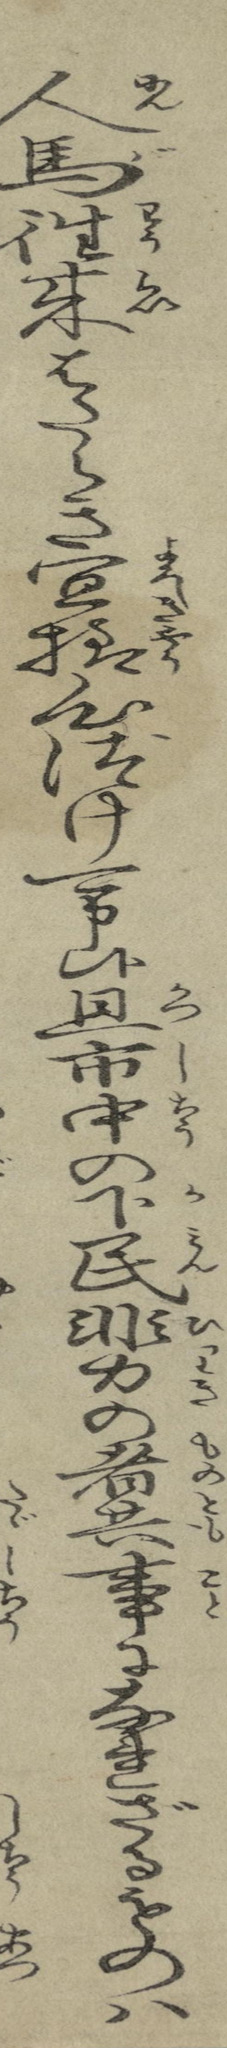人馬往来はたらき冝様心つけ可申候且市中の下民非力の者共事になれざるものは
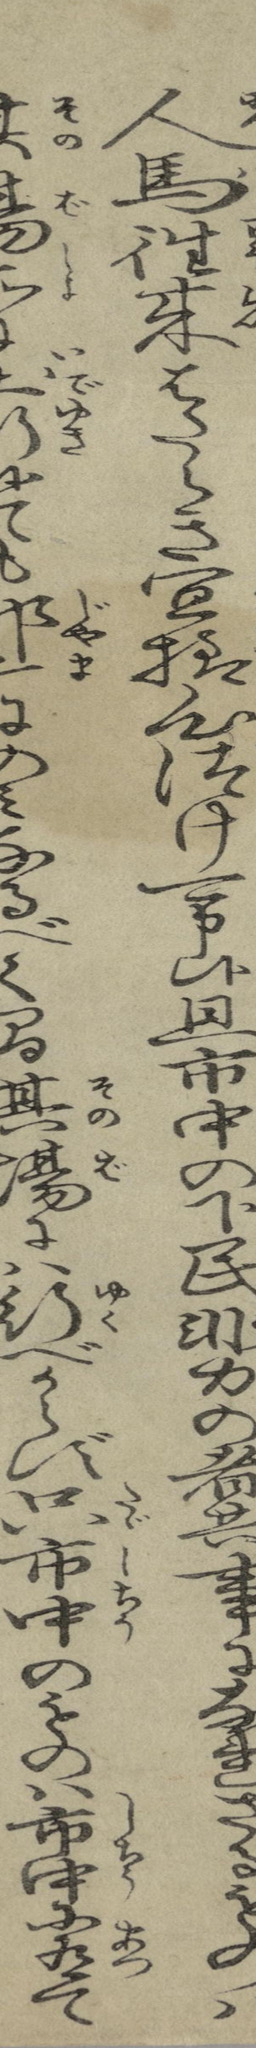其場所に出行候ても邪魔のみなるべく間其場には行べからず只市中のものは市中に有て
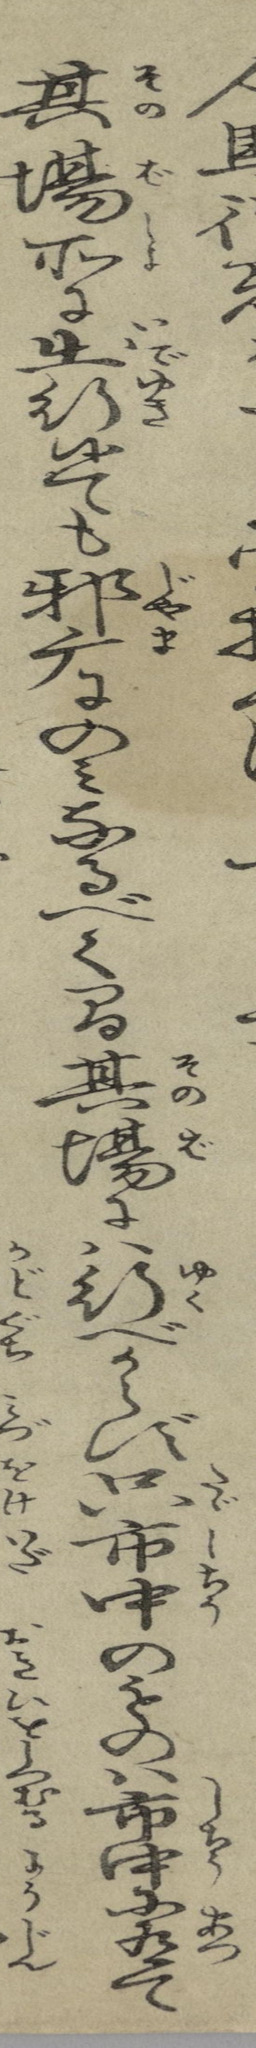其場所に出行候ても邪魔のみなるべく間其場には行べからず只市中のものは市中に有て
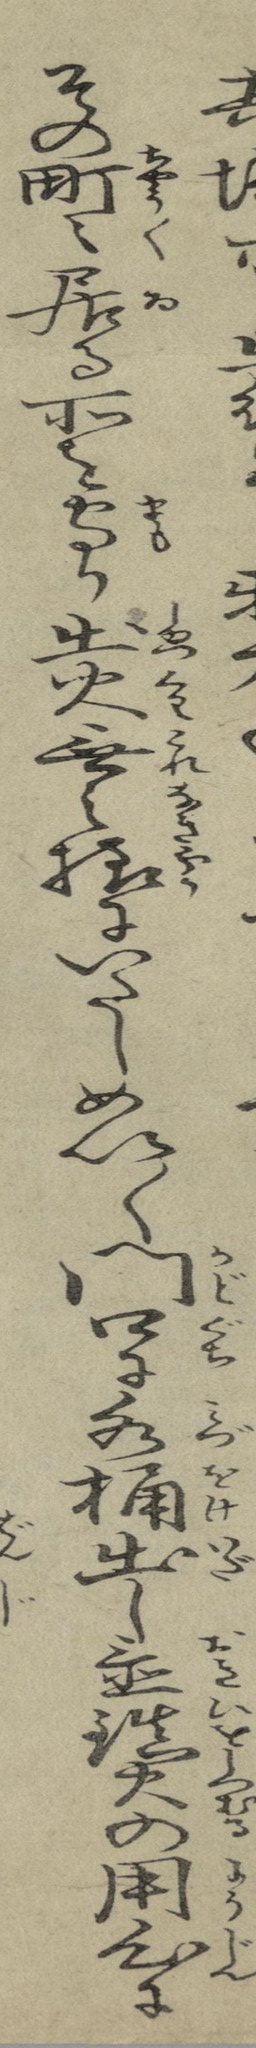その町々居る所を守り出火之無之様にいたしめい〳〵門口に水桶出し置鎮火の用心に
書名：火の元用心肝要之事・諸人安全心得の事
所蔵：東京大学地震研究所図書室 Earthquake Research Institute Library, The University of Tokyo, JAPAN
